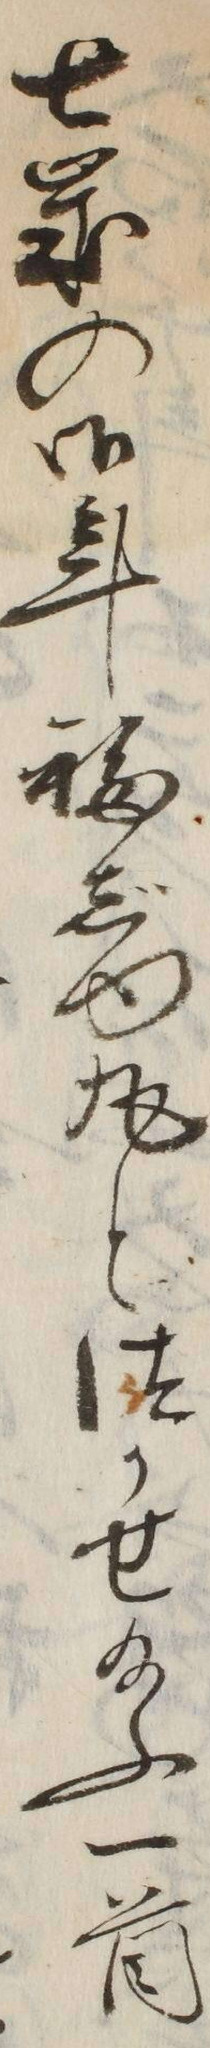七歳の御年福じゆ丸とつかせ給ふ一首
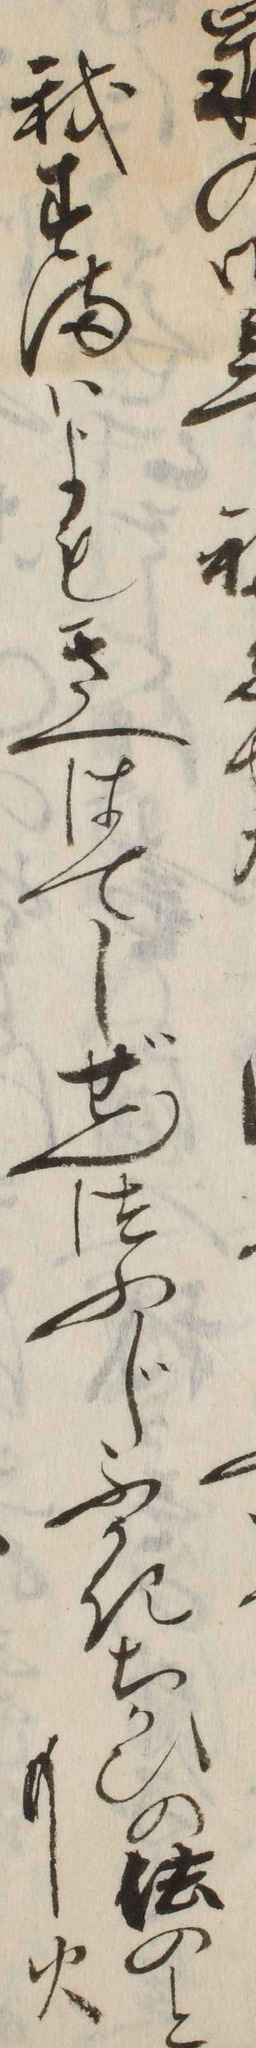我すまはよもきへはてしぜんつふじふかきちひの法のと
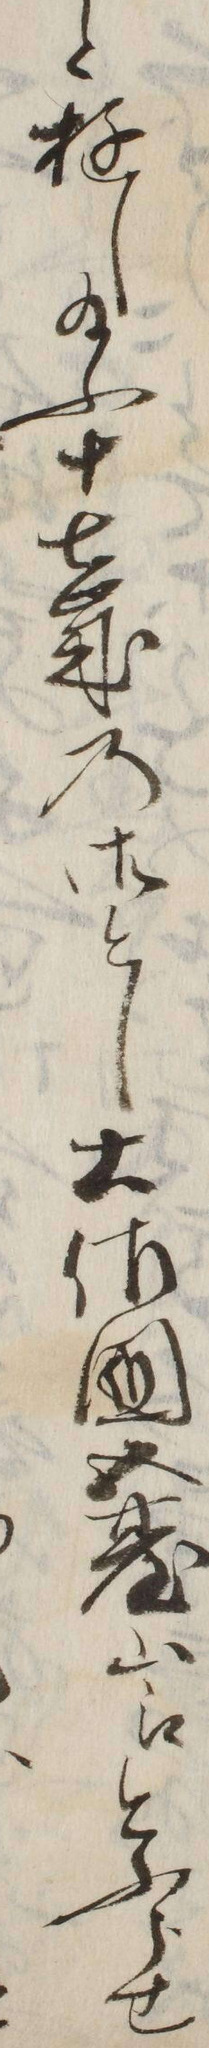と遊し給ふ十七歳の御とし土佐国五台山えとふらせ
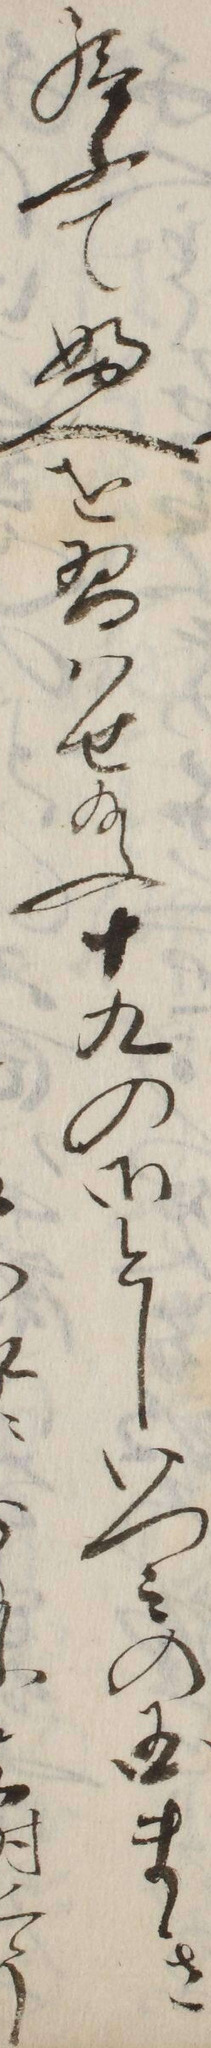給ふてふへを習はせ給ふ十九の御としいつみの国まき
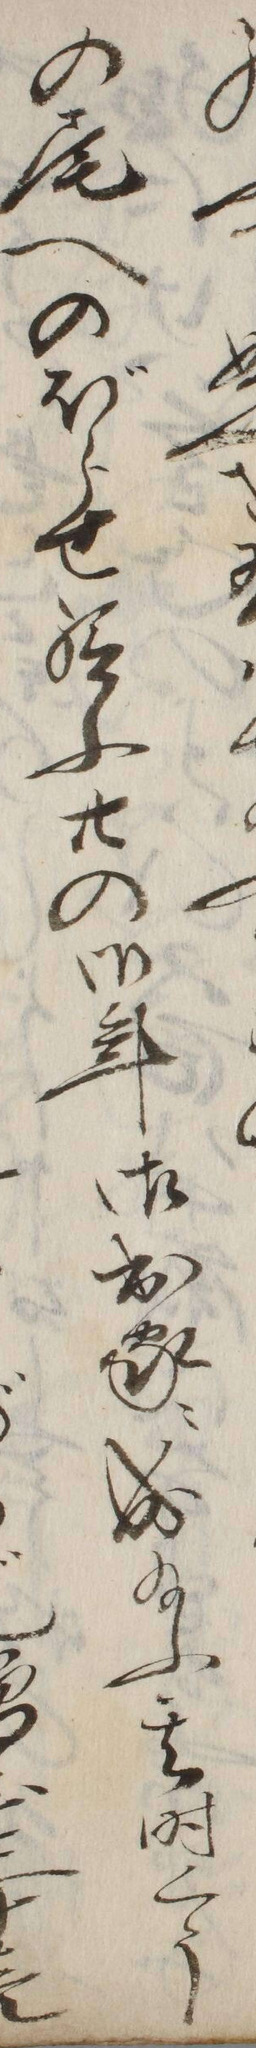の尾へのぼらせ給ふ廿の御年御出家に成給ふ其時くう
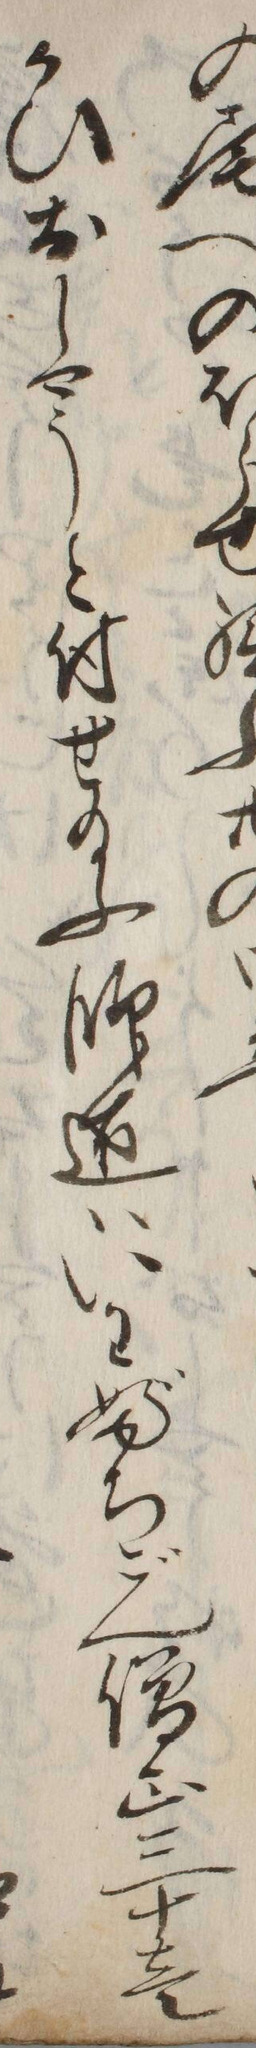かひおしやうと付せ給ふ師匠はいわぶちごん僧正三十壱
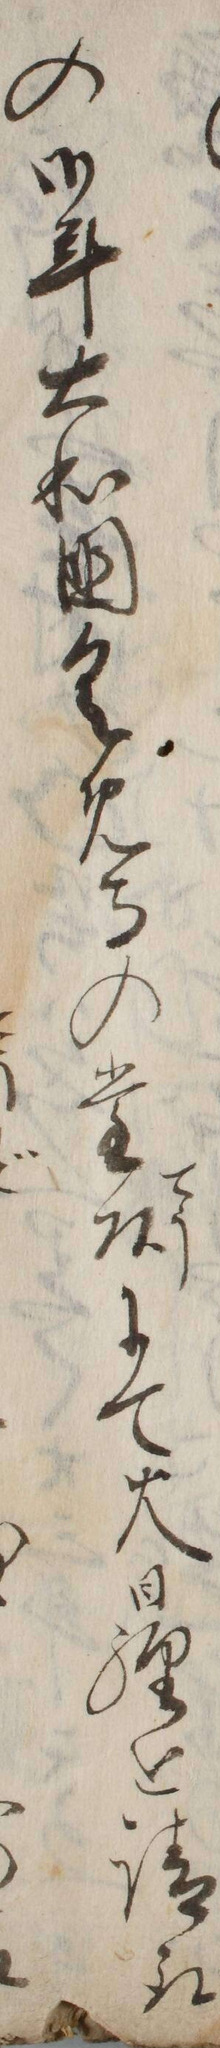の御年大和国くめ寺の堂頭にて天日経を請取
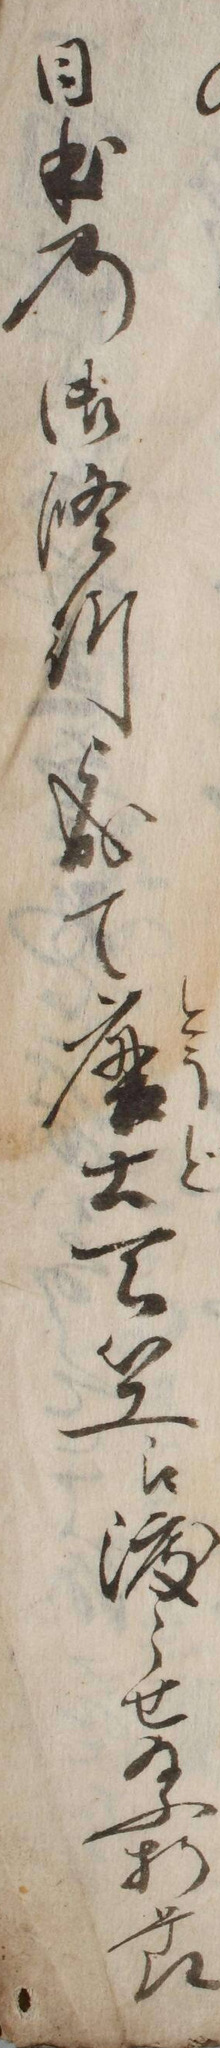日本の御修行被成て唐土天竺え渡らせ給ふ折節

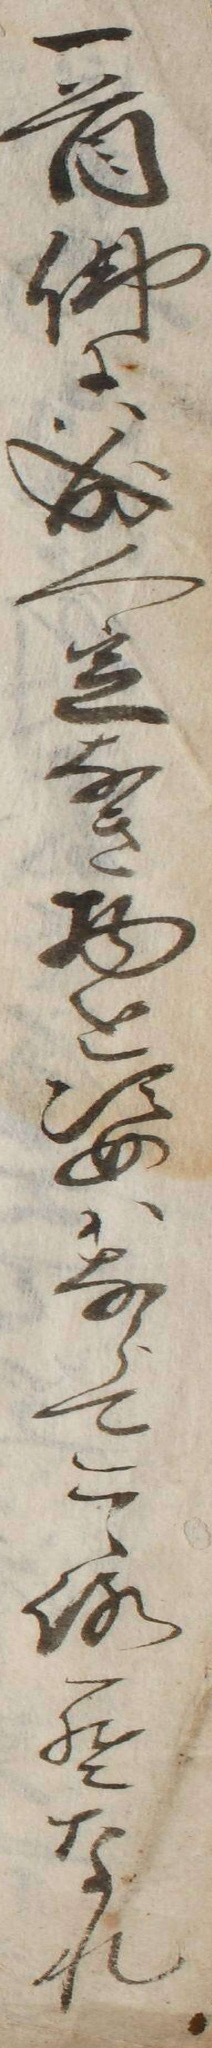一首仏には成人定なき物を姿はならてこゝろこそなれ
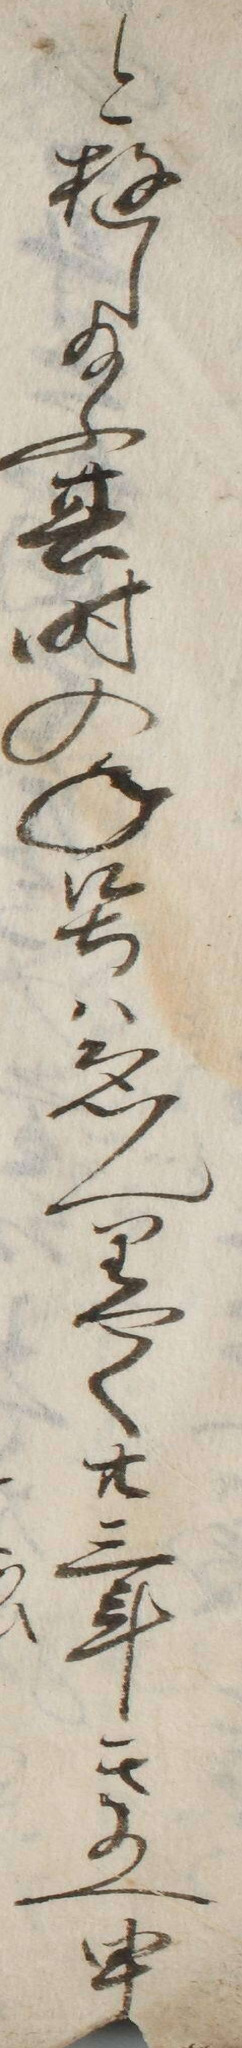と遊し給ふ其時の年号はゑんりやく廿三年きのへ申
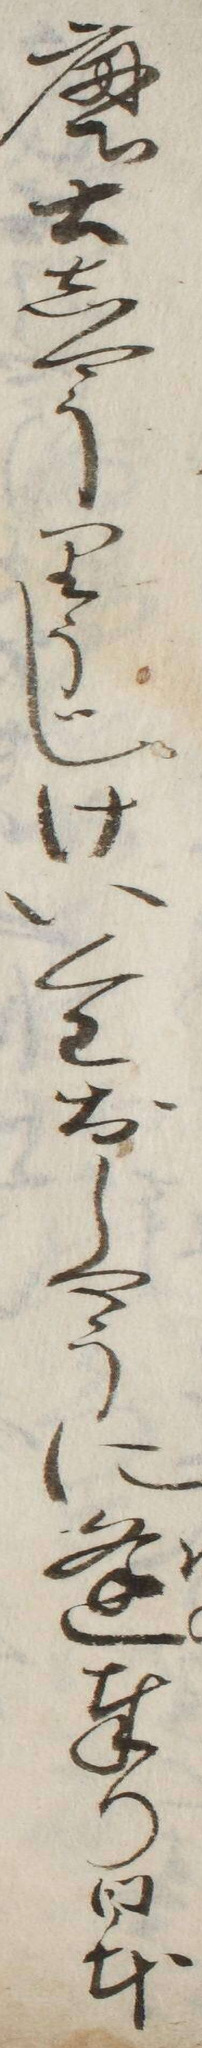唐土しやうりうじけいくわ出しやうに逢奉り日本
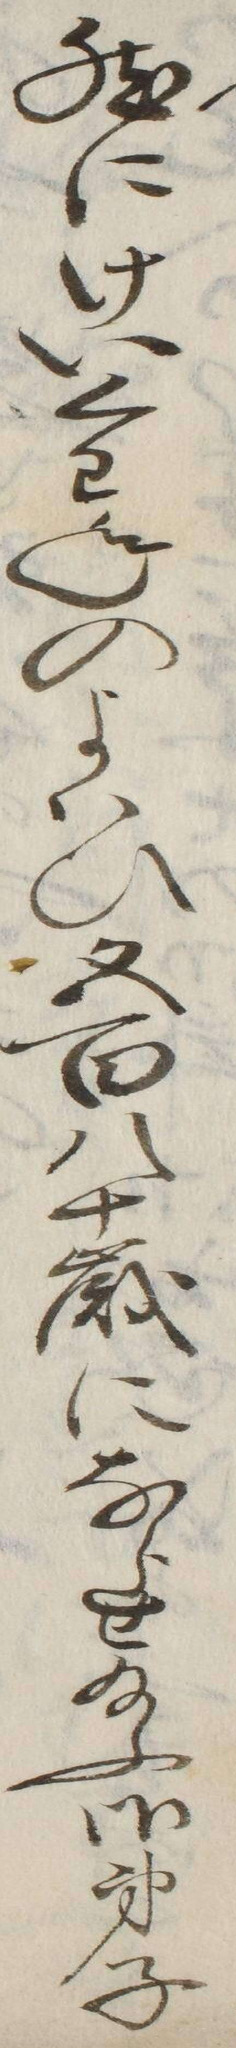然にけいくわ年のよはひ五百八十歳にならせ給ふ御弟子
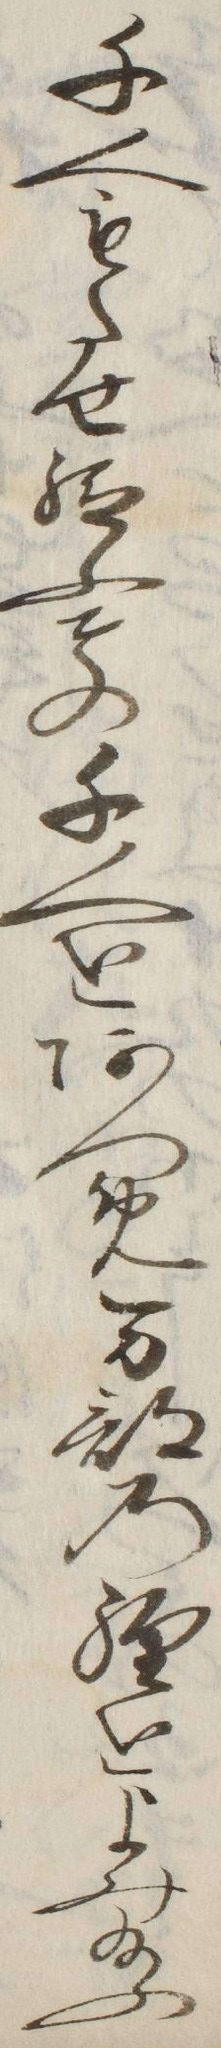千人もたせ給ふもの千人をあつめ万部の経をよみ給ふ
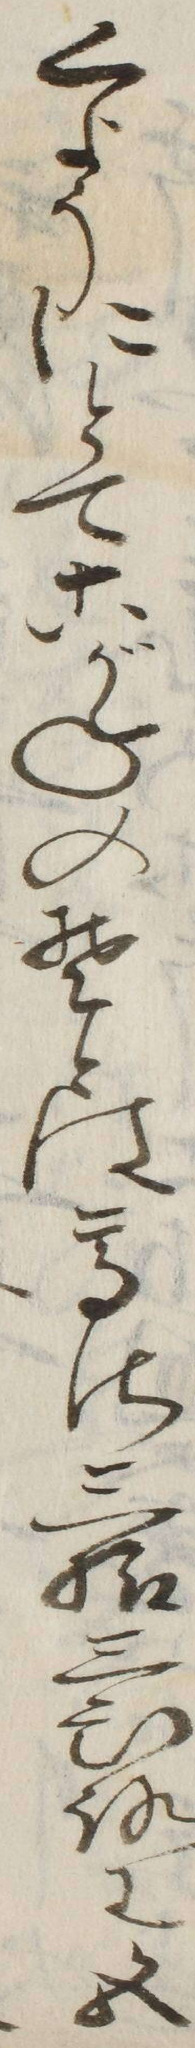くようにとてこがねのそとは高さ三拾三ひろは五
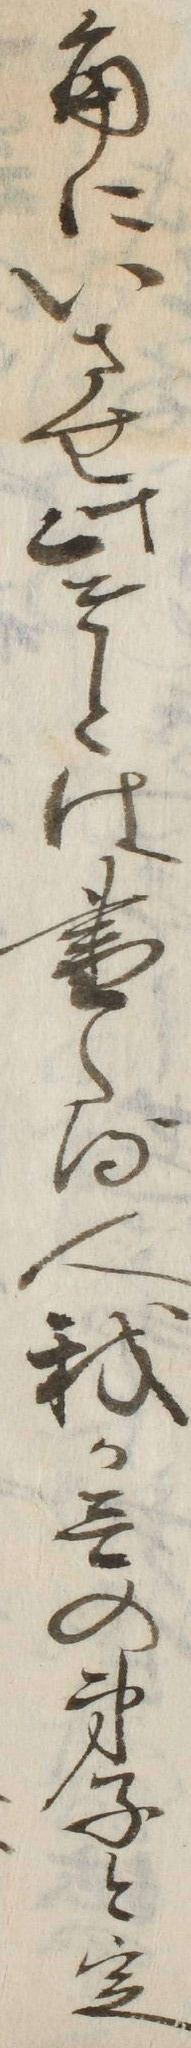角にいさせ此そとは書ゝる人我か壱の弟子と定
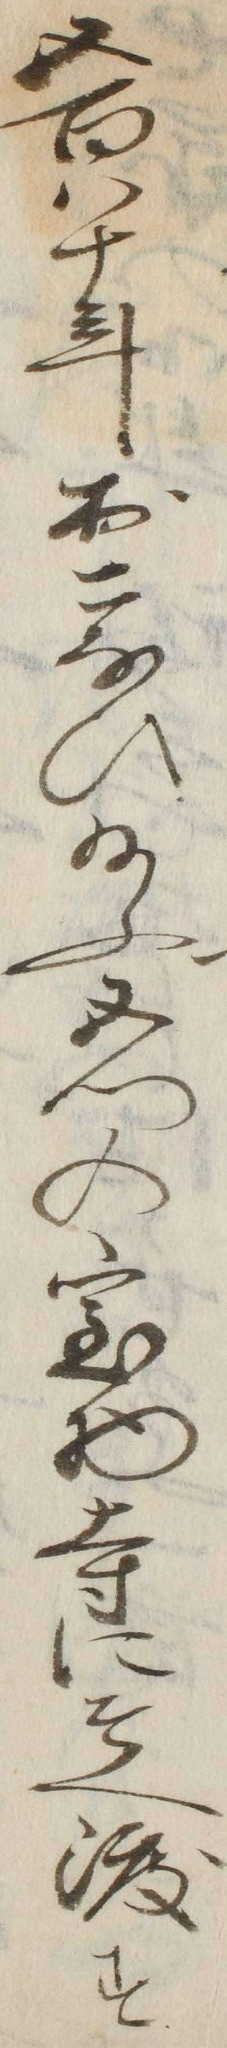五百八十年おこなひ給ふ五つの宝物寺にすへ渡す
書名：奉弘法大師御傳記
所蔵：国文学研究資料館
